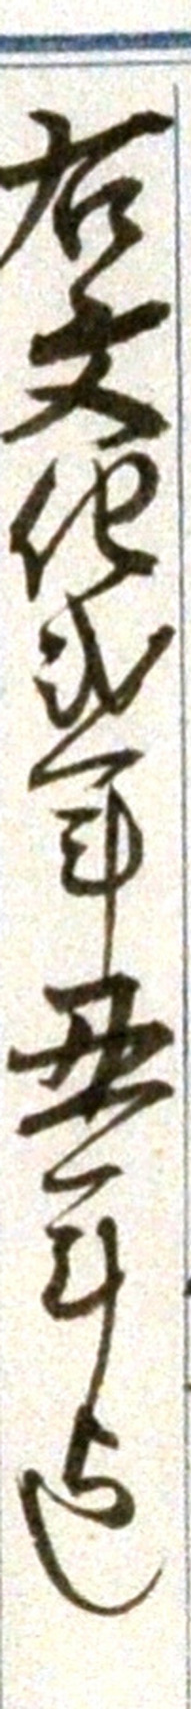右文化弐年丑年迄
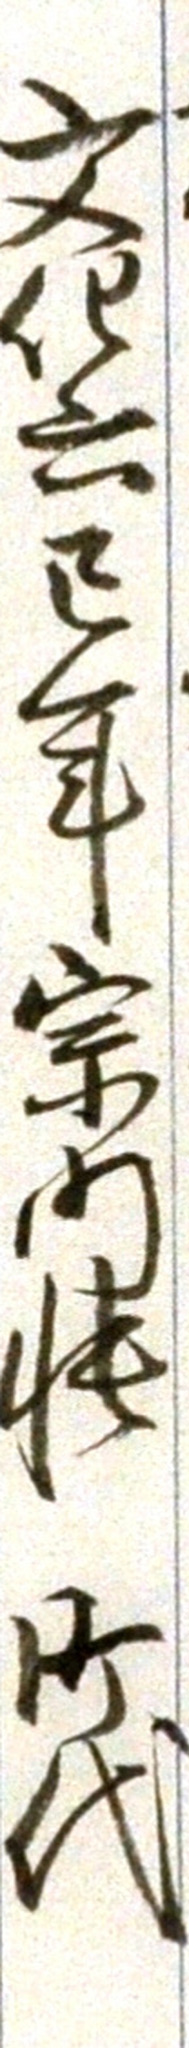文化六巳年宗門帳町代
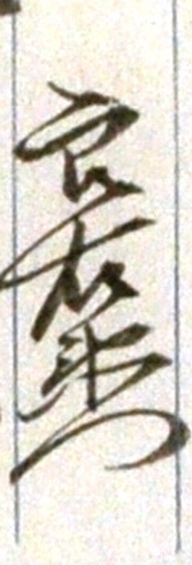又右衛門
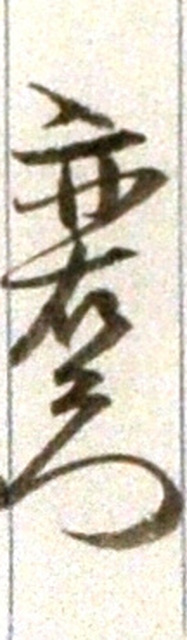又右衛門
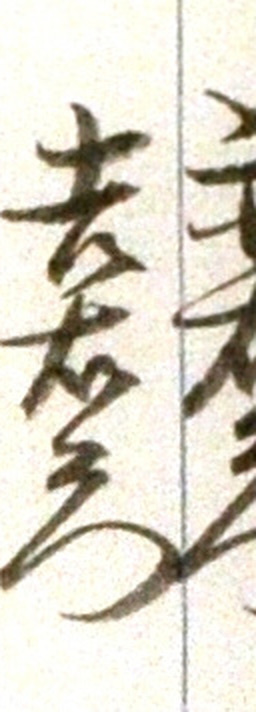又右衛門

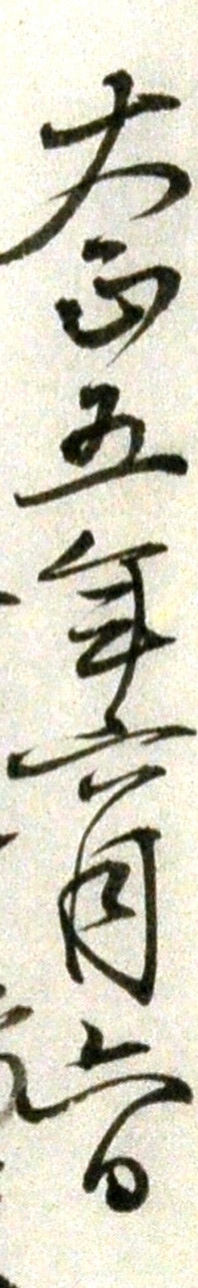大正五年六月六日
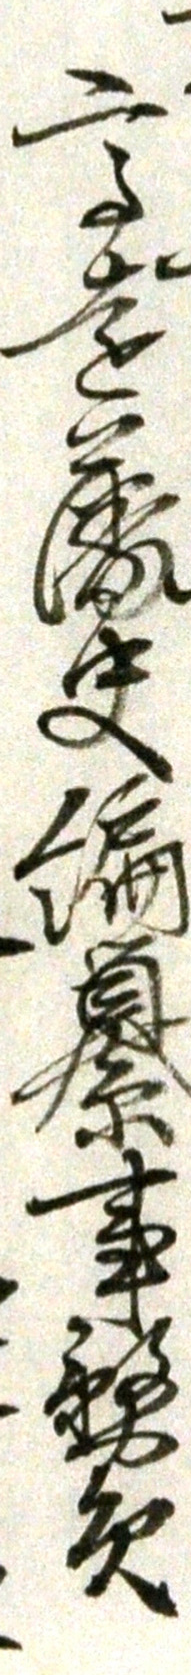高遠藩史編纂事務員
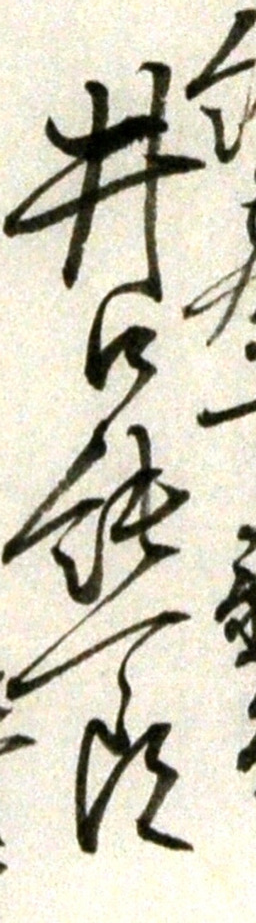井口純一郎
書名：町方町代名前書
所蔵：伊那市立高遠町図書館・合同会社AMANE
